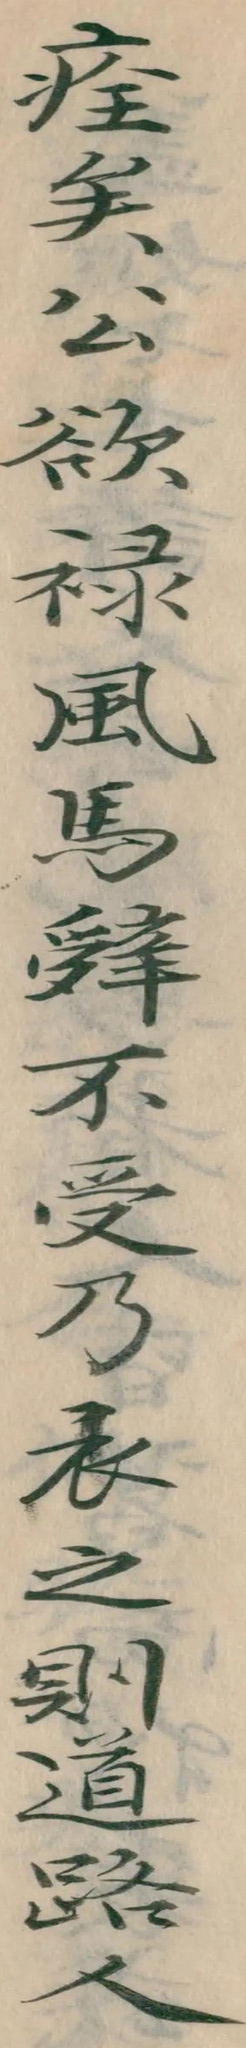痊矣公欲禄風馬辞不受乃表之則道路人
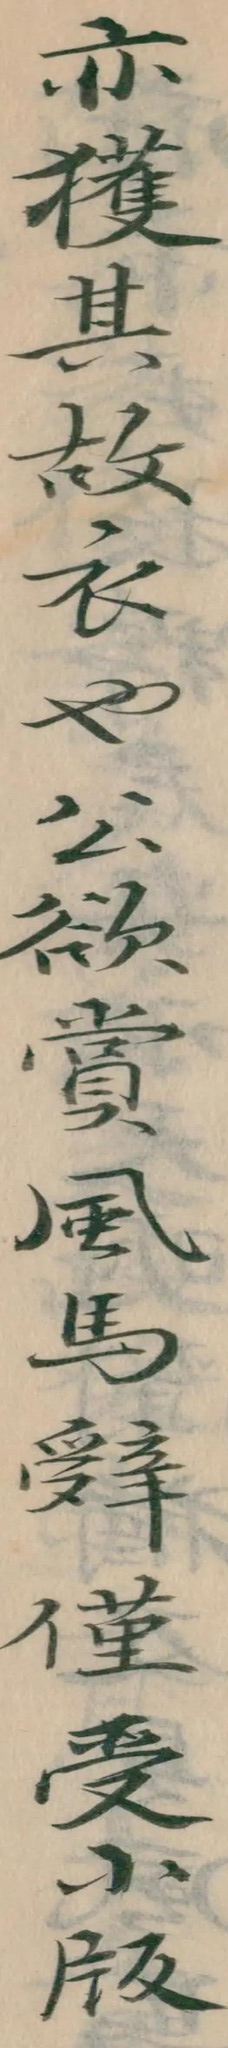亦獲其故衣也公欲賞風馬辞僅受小版
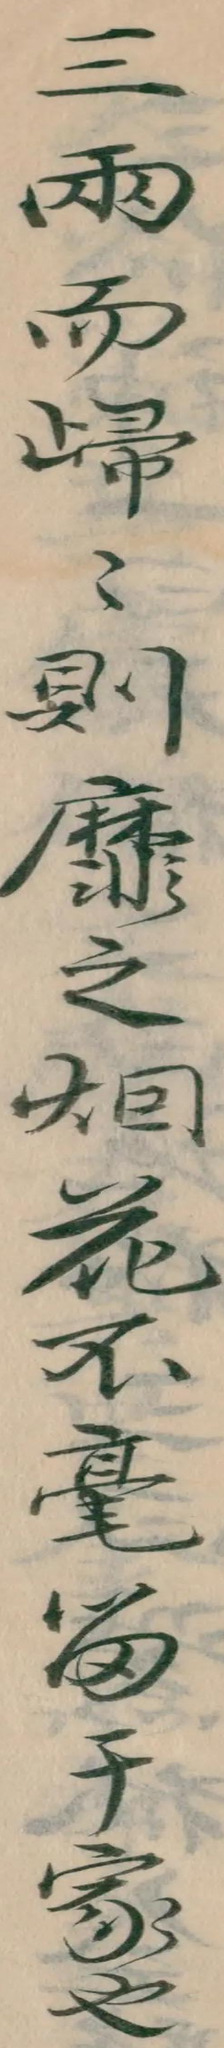三両而帰々則靡之𤇆花不毫留于家也
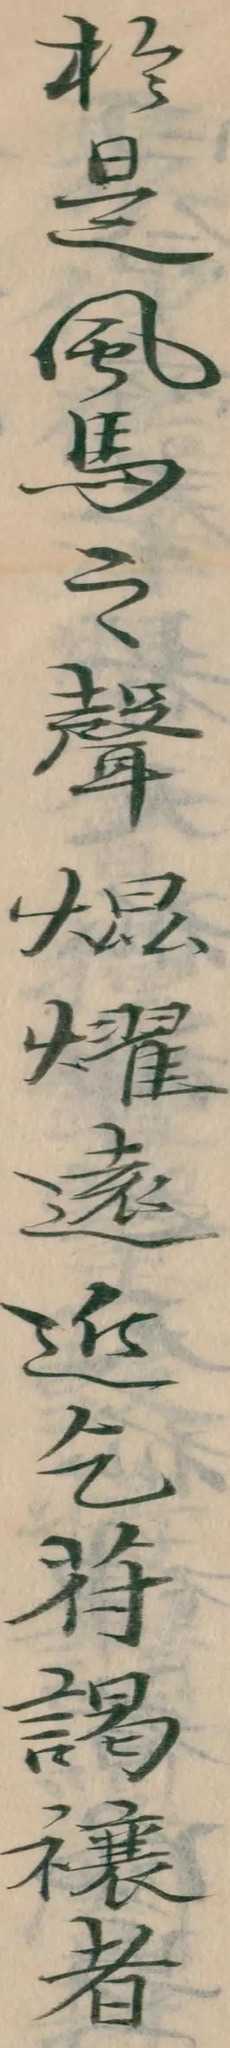於是風馬之聲焜燿遠近乞符謁禳者
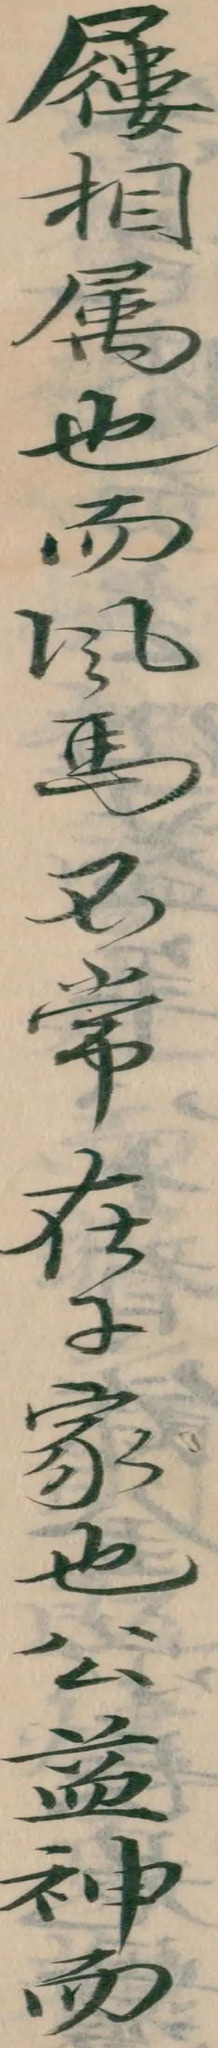屨相属也而風馬名常在尓家也公益神而
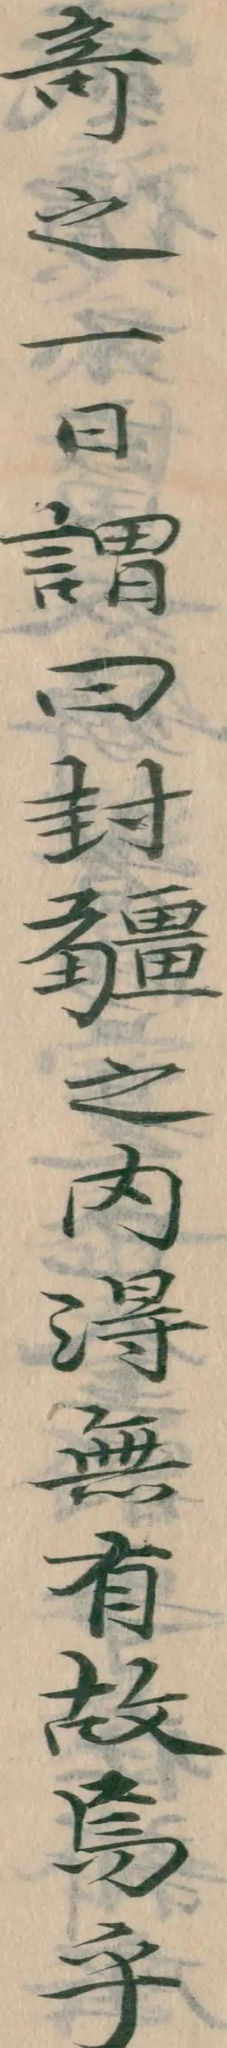奇之一日謂曰封彊之内得無有故焉乎
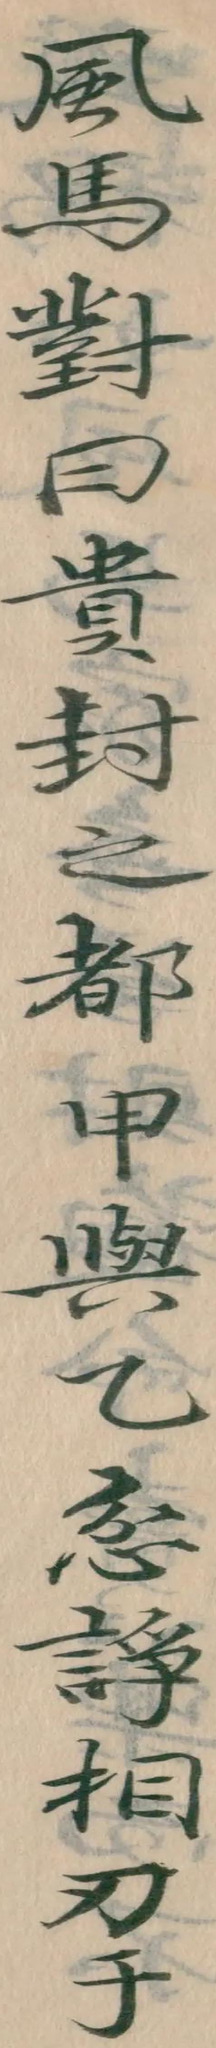風馬対曰貴封之都甲与乙忿諍相刃于
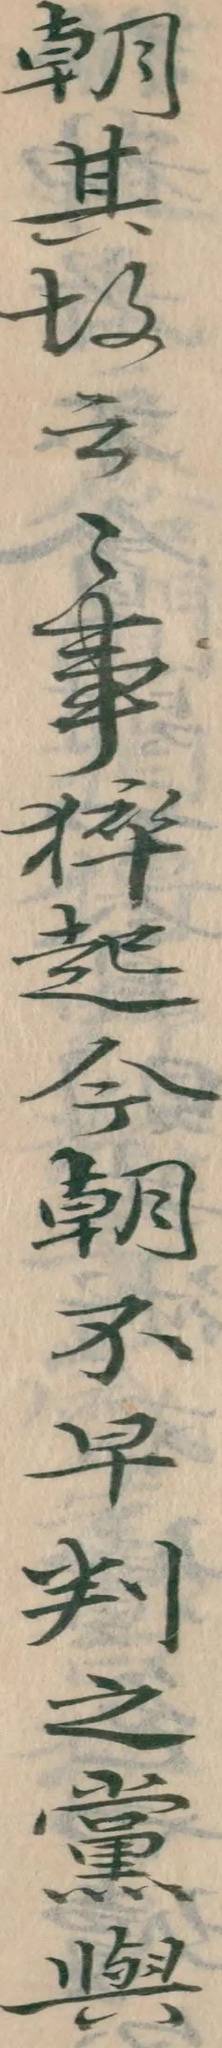朝其坂云々事猝起今朝不早判之党与
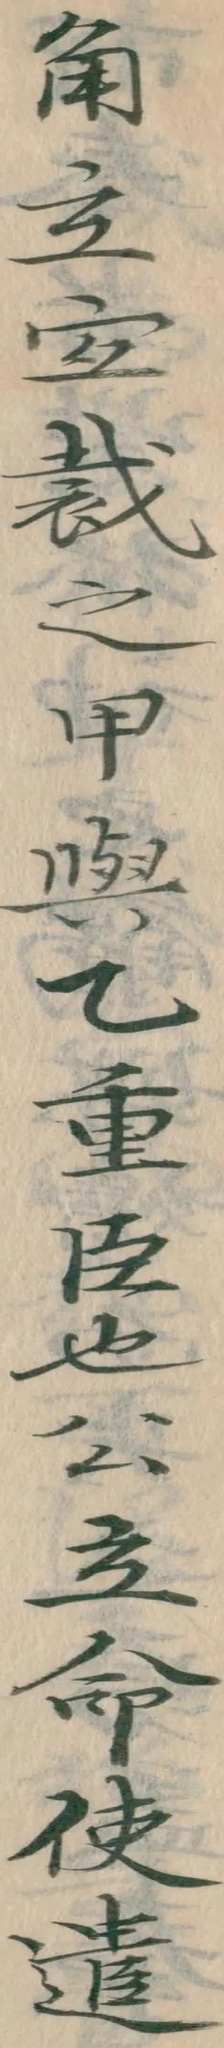角立宣裁之甲與乙重臣也公立命使遣
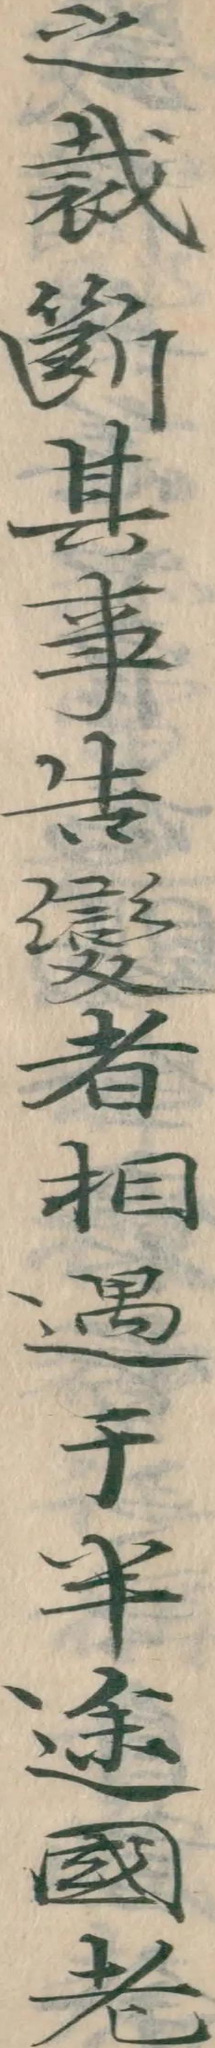之裁断其事告変者相遇于半途国老
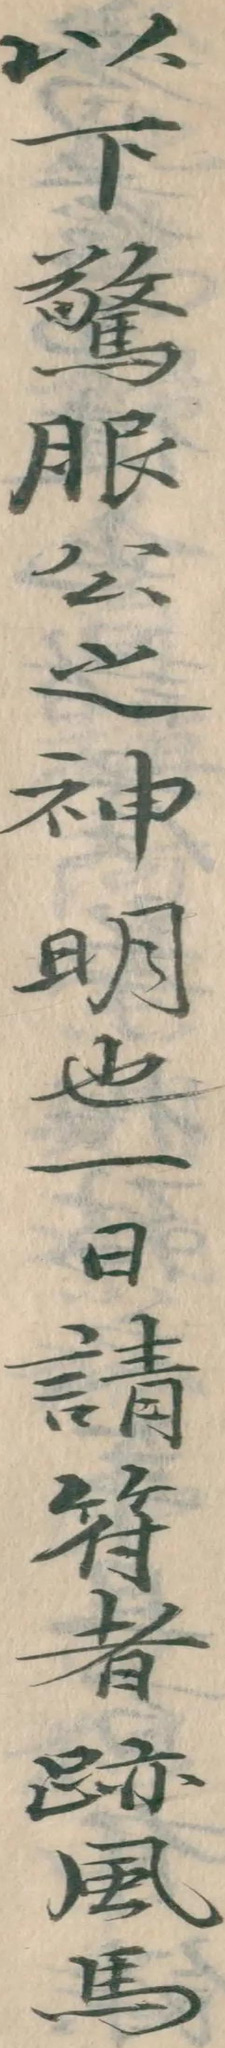以下驚眼公之神明也一日請符者跡風馬
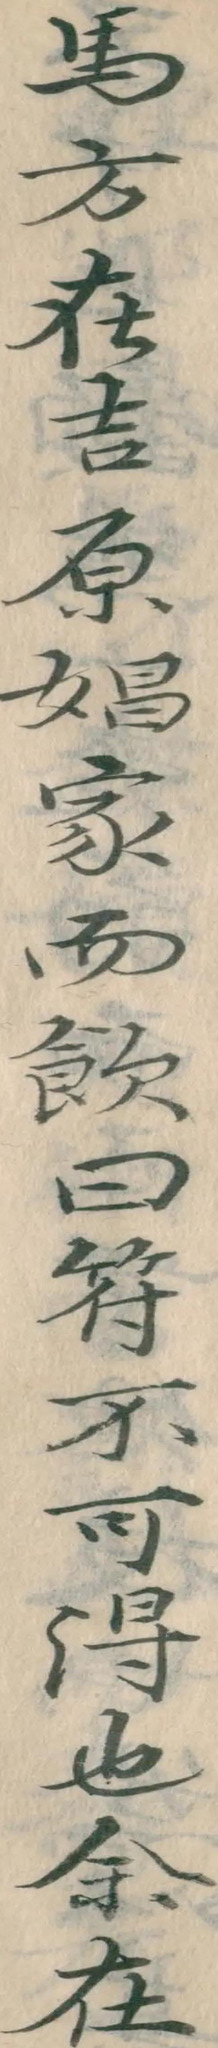馬方在吉原娼家而飮曰符不可得也余在
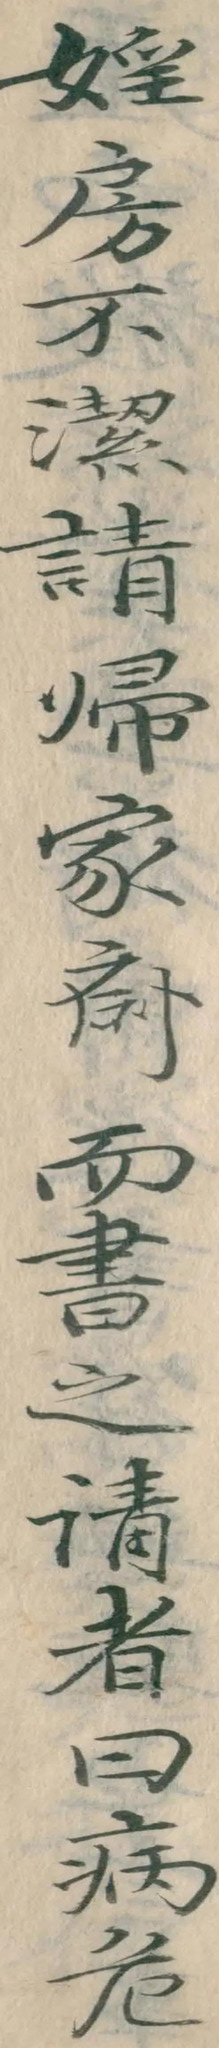婬房不潔請帰家斎而書之請者曰病危
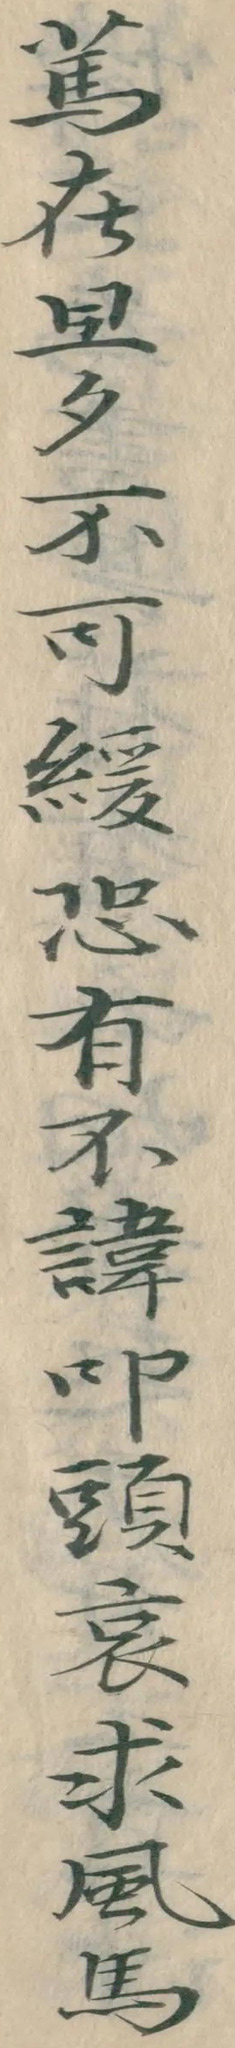篤在旦夕不可緩恐有不諱叩頭哀求風馬

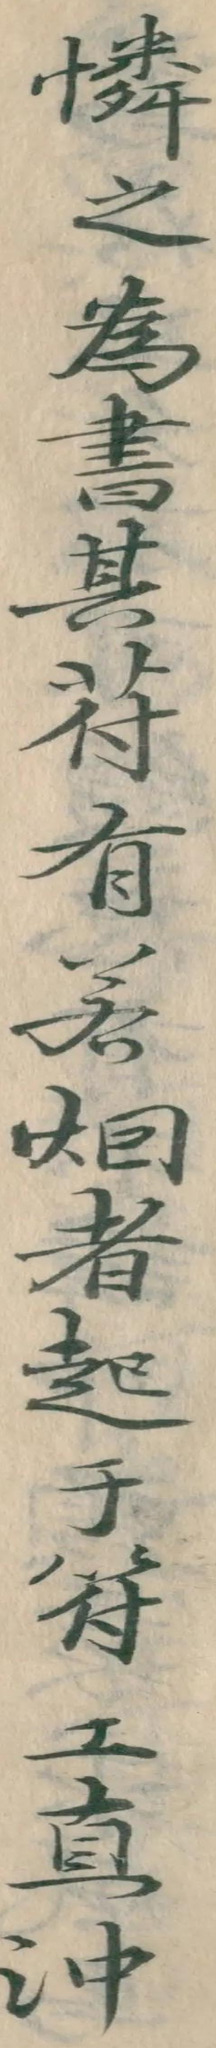憐之為書符有若𤇆者起于符工真沖
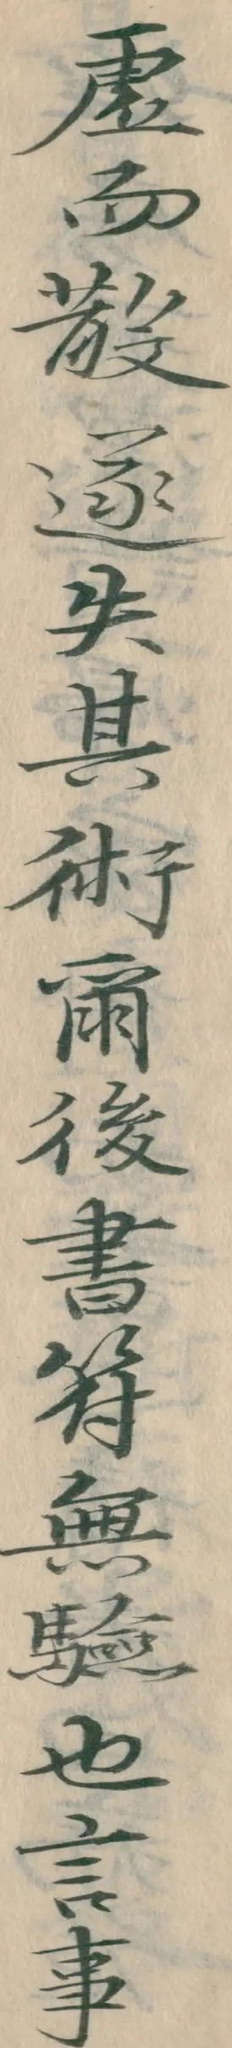虚而散遂失其術爾後書符無験也言事
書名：輪池叢書. 12
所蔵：国立国会図書館 National Diet Library, JAPAN
